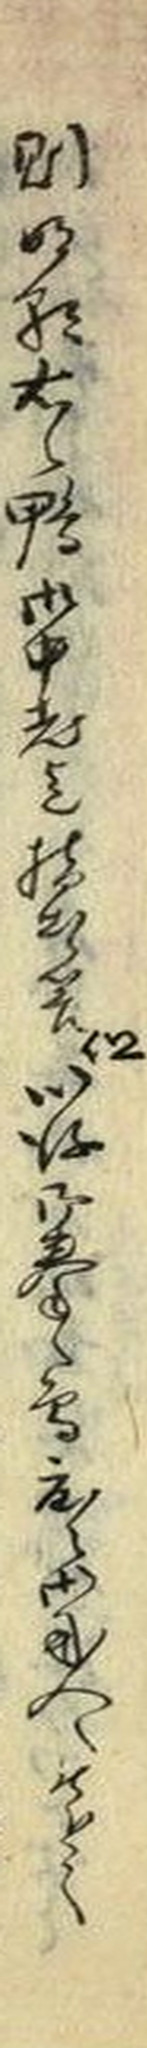則明朝右之鴨御中老迄指出候筈但以後御拳之鳥度々御用人へ被下之
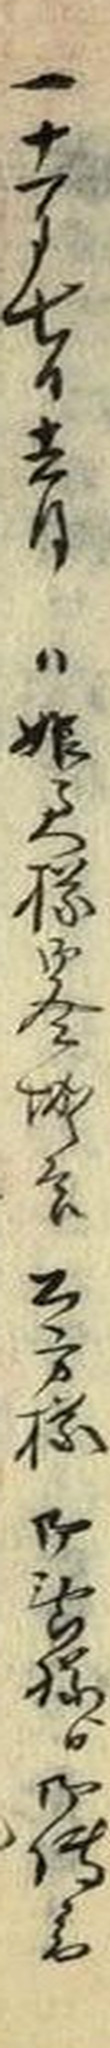一十一月七日去月日姫君様御登城之節公方様御台様ゟ御伝ニ而
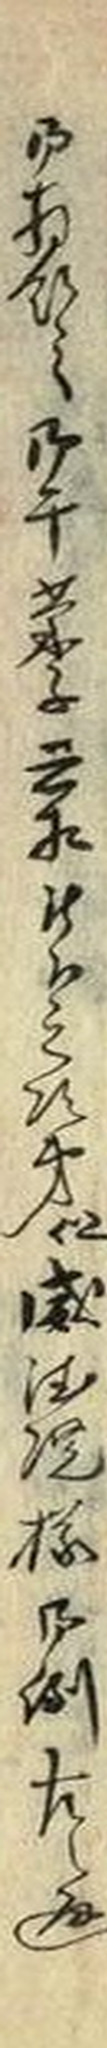御拝領之御干菓子二箱被下之次第但威徳院様御例左之通
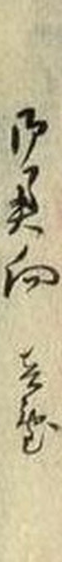御奥向壱台
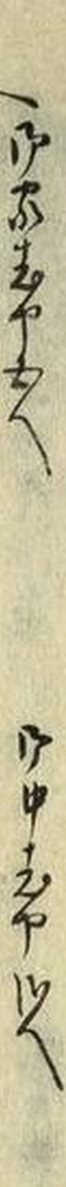御家老中五人御中老中弐人
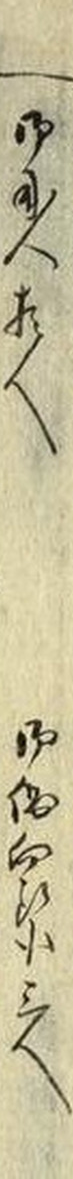御用人拾人御側向頭取三人
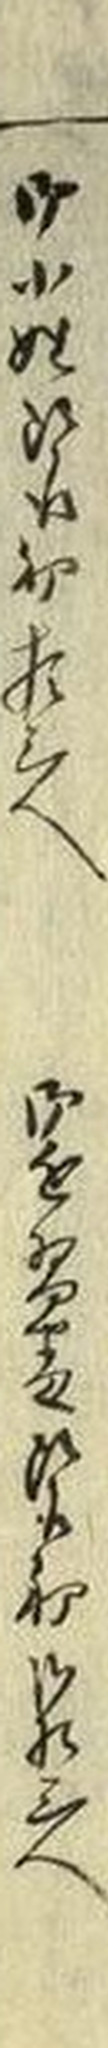御小姓頭取初拾三人御近習番頭取初弐拾三人
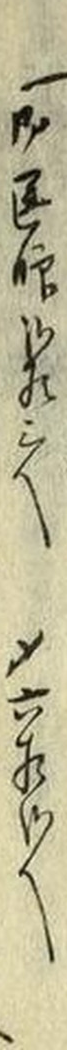御医師弐拾三人〆六拾弐人
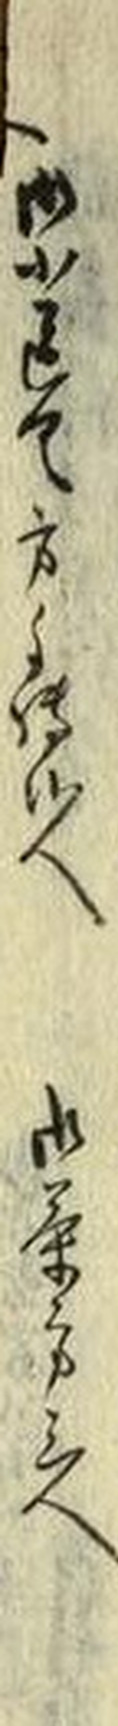御小道具方手伝弐人御茶方三人
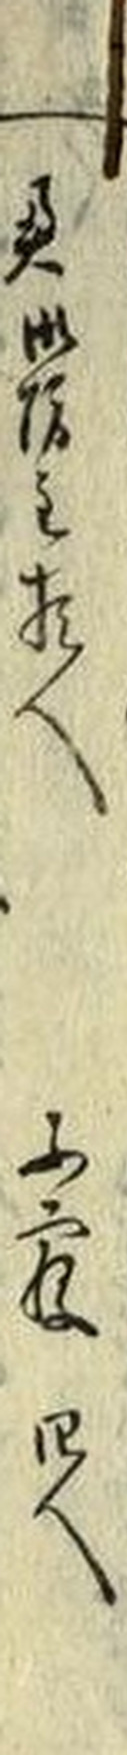奥御坊主拾人不寝四人
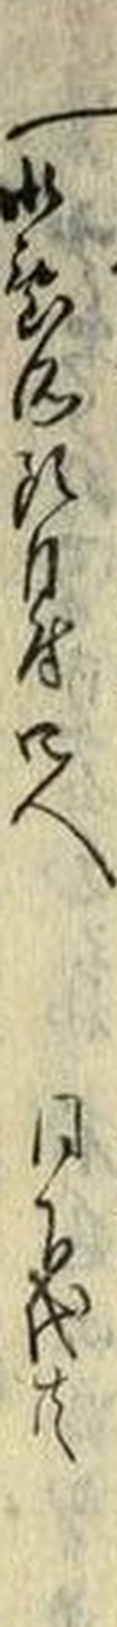御台所頭目付四人同下代共
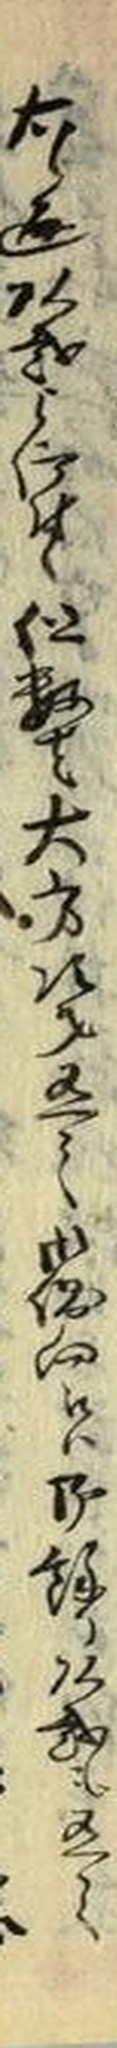右之通頂戴被仰付候但数者大方次第有之御側向江ハ御余り頂戴も有之
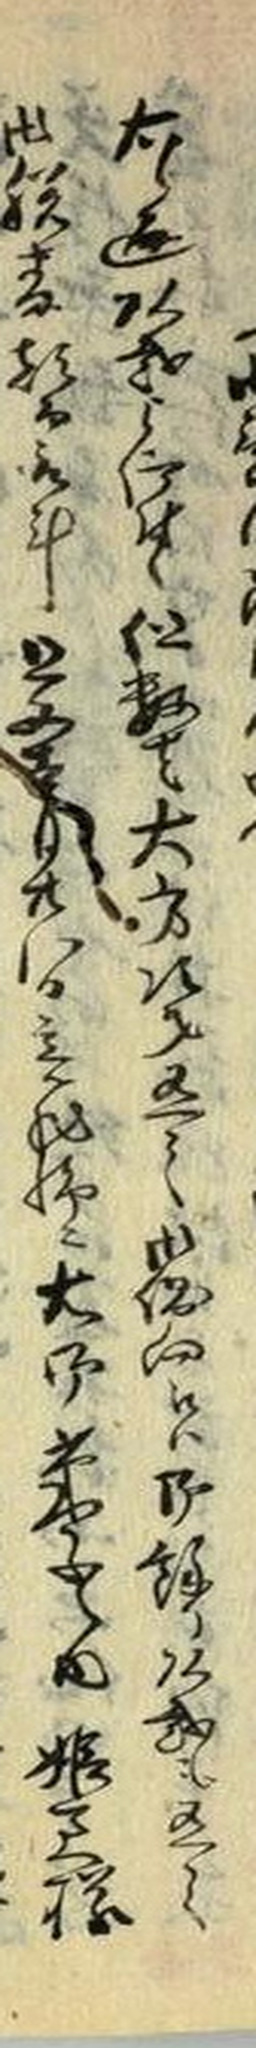御膳番都而取計且又去月廿八日立飛脚ニ右御菓子之内姫君様
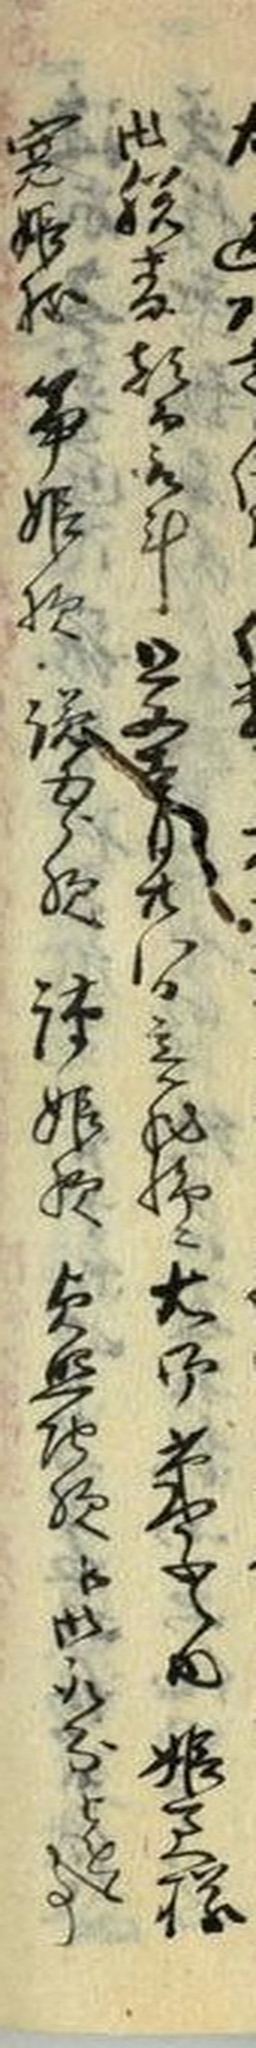寛姫様箏姫様謙五郎様謹姫様貞照院様江御取分被進候事
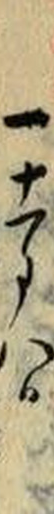一十一月八日
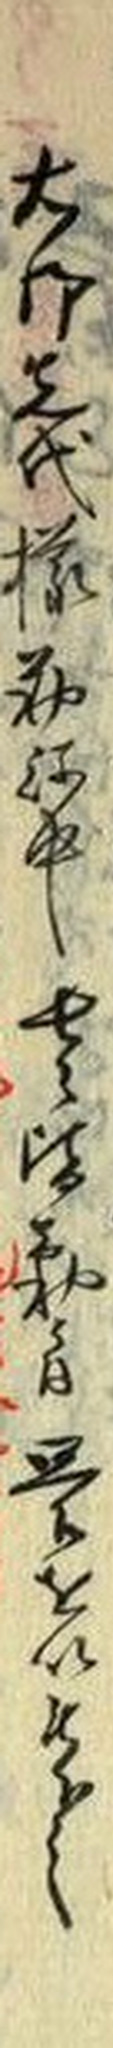右御先代様勤役中長々皆勤ニ付思召を以被下之
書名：少傅日録抄（斉承付側向頭取日記、在国）
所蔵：福井県文書館 Fukui Prefectural Archives
